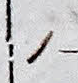1
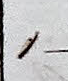1
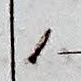1
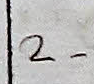2
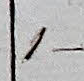1
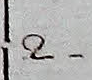2
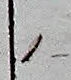1
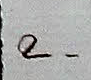2
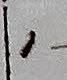1
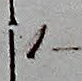1
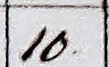10.
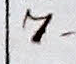7
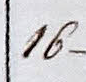16
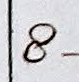8
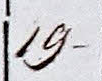19
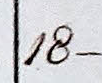18
